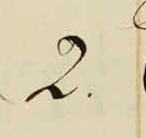2.
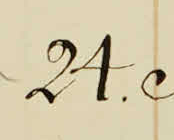24.
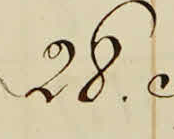28.
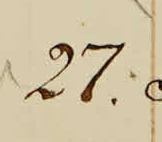27.
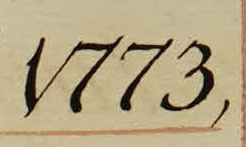1773
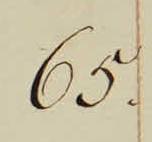65
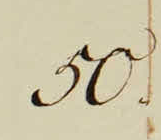50
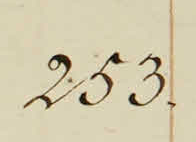253
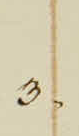3
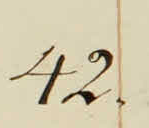42
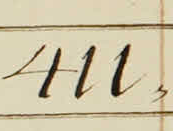411
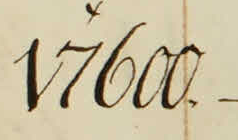17600.
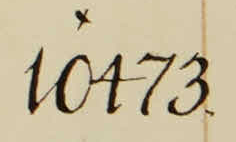10473.
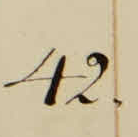42
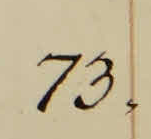73
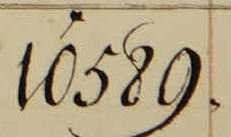10589
